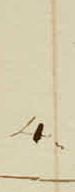4
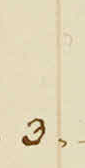3
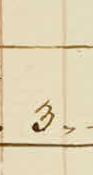3
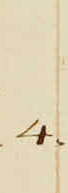4
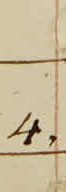4
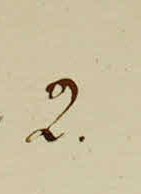2.
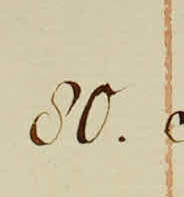80.
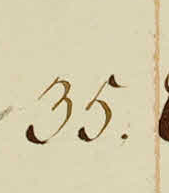35.
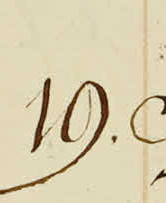19.
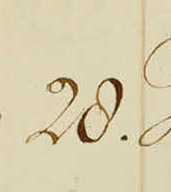28.
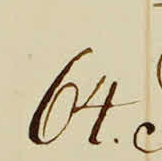64.
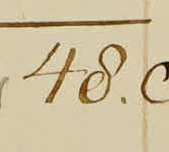48.
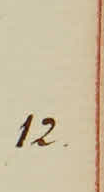12.
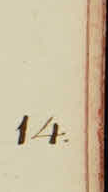14.
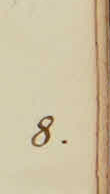8.
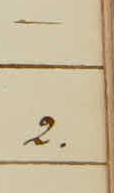2.
